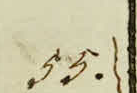55.
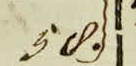58.
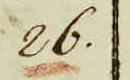26.
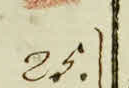25.
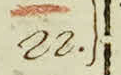22.
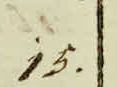15.
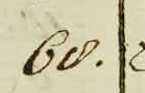68.
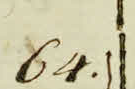64.
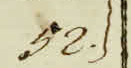52.
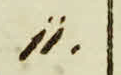11.
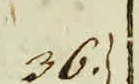36.
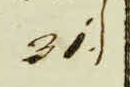31.
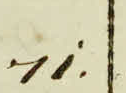71.
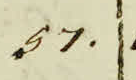57.
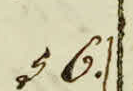56.
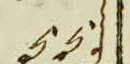55.
